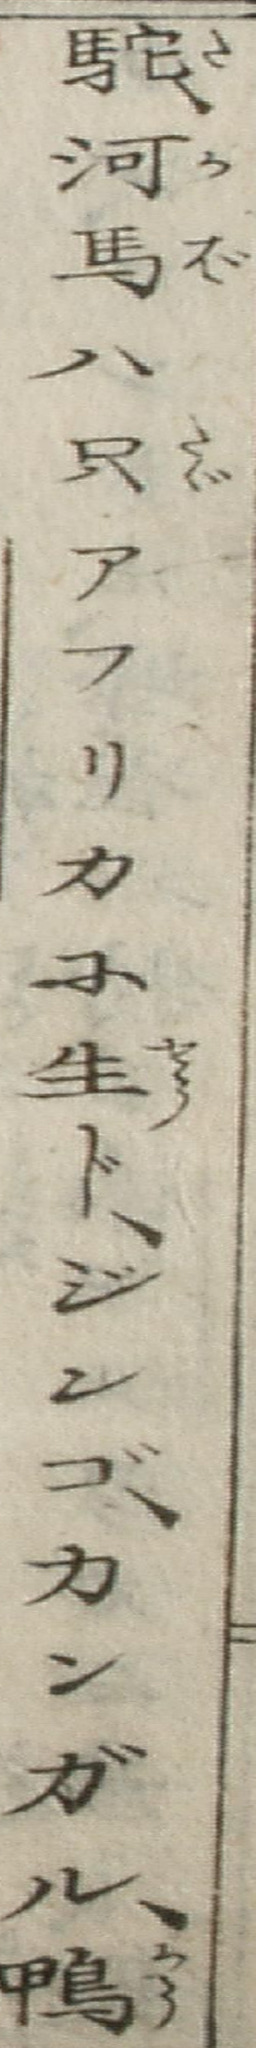駝、河馬は只アフリカに生じ、ジンゴ、カンガル、鴨
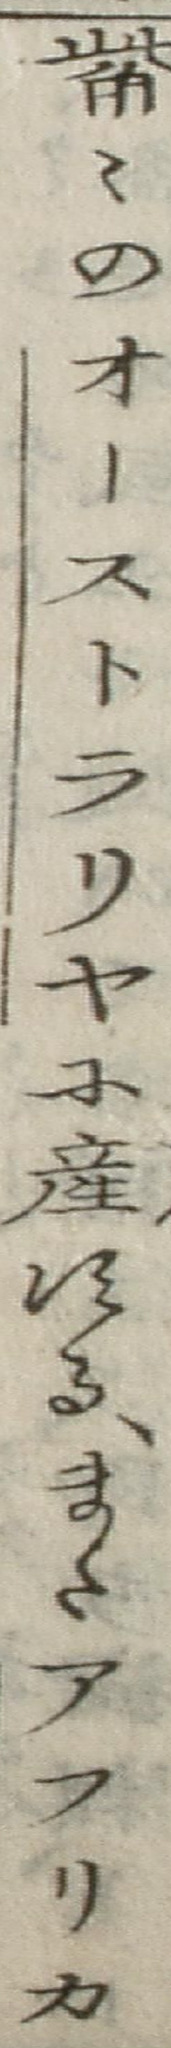觜々のオーストラリヤに産する、またアフリカ
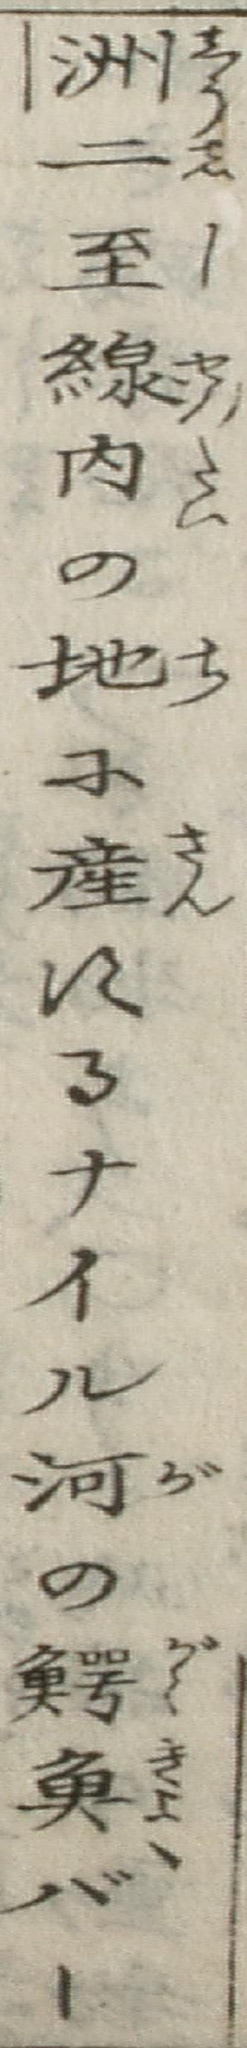洲二至線内の地に産するナイル河の鰐魚、バー
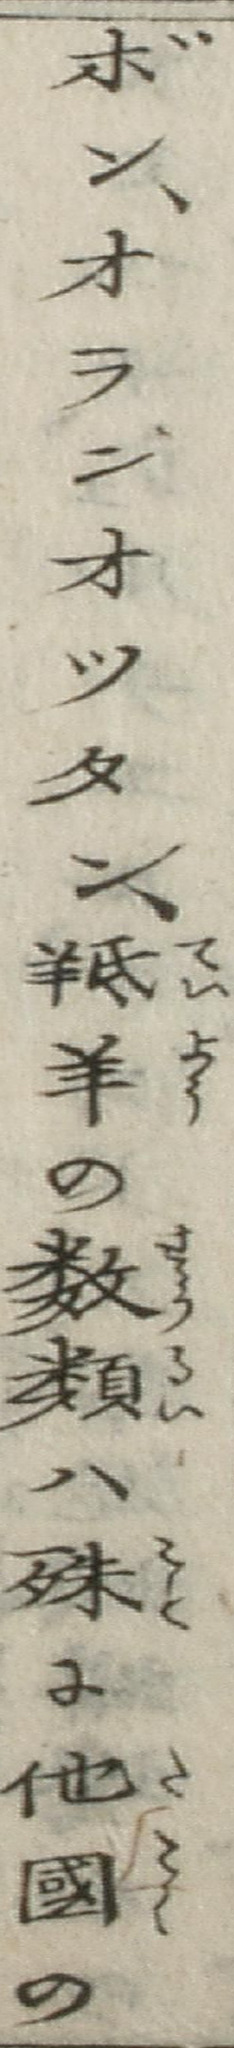ボン、オランオツタン、羝羊の数類は殊に他国の
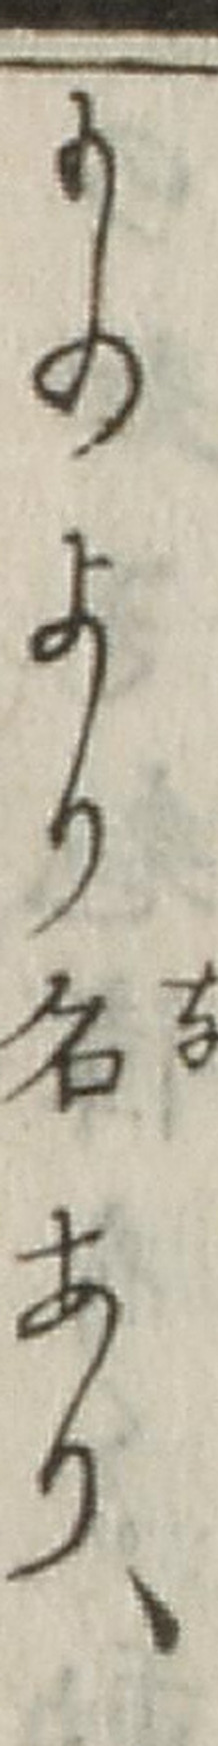ものより名あり、
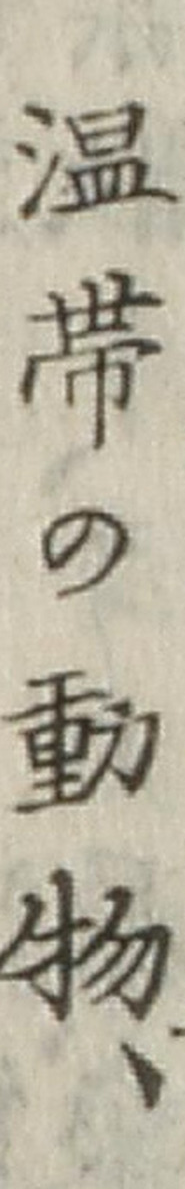温帯の動物、
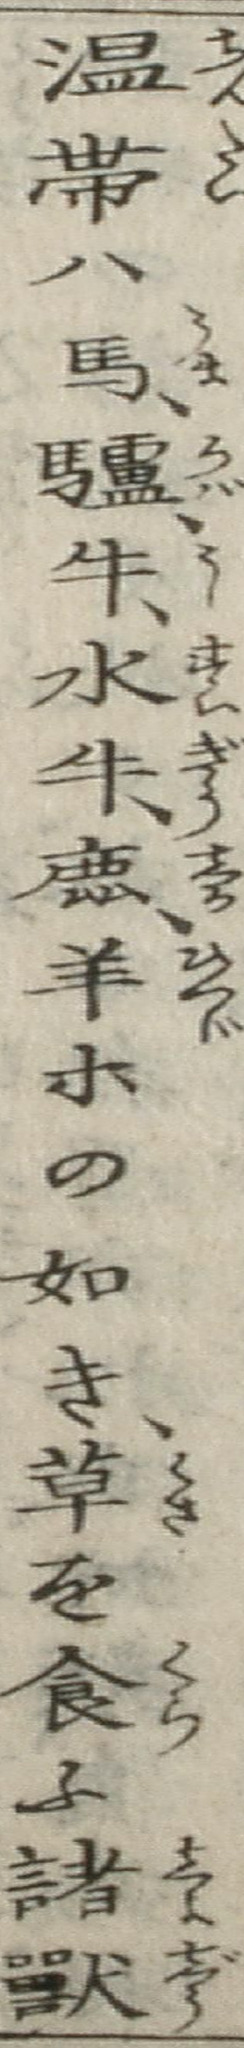温帯は馬、驢、牛、水牛、鹿、羊等の如き、草を食ふ諸獣
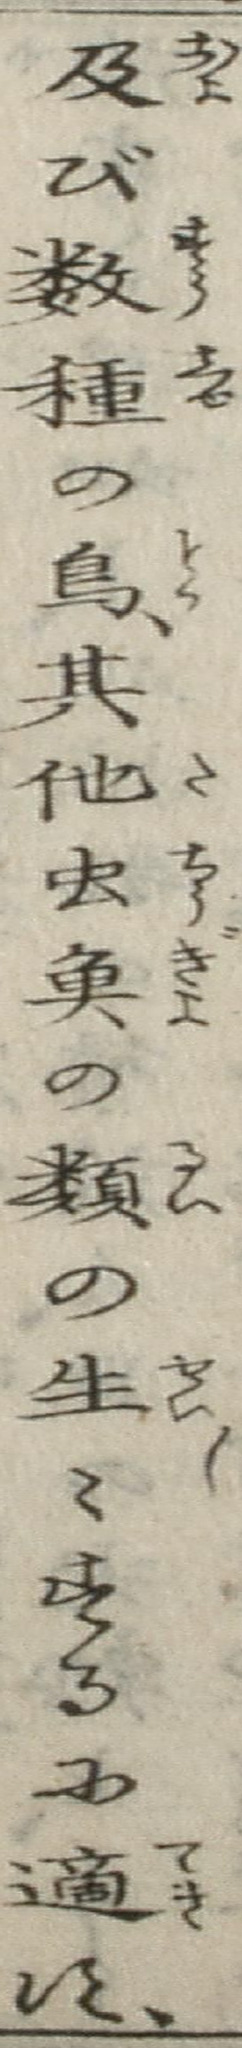及び数種の鳥、其他虫魚の類の生々するに適す、
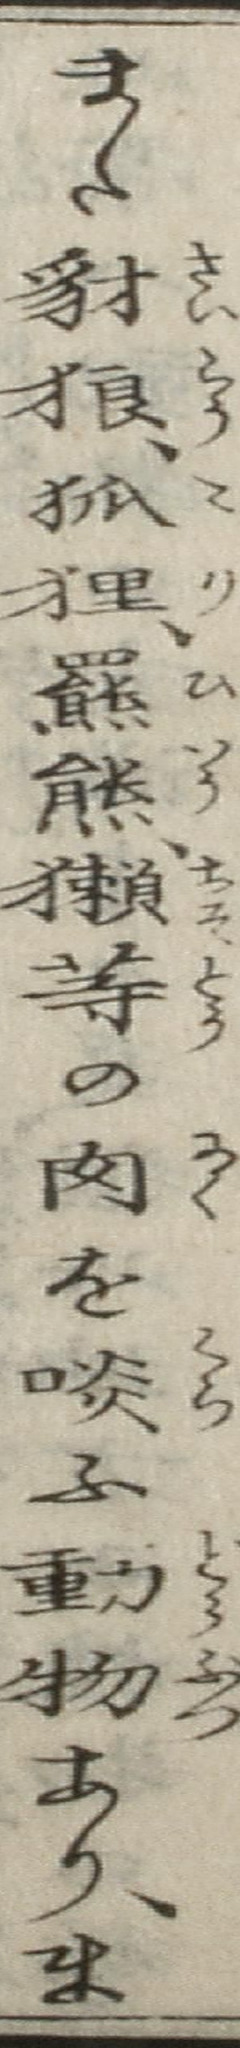また豺狼、狐狸、羆熊、獺等の肉を啖ふ動物あり、ま
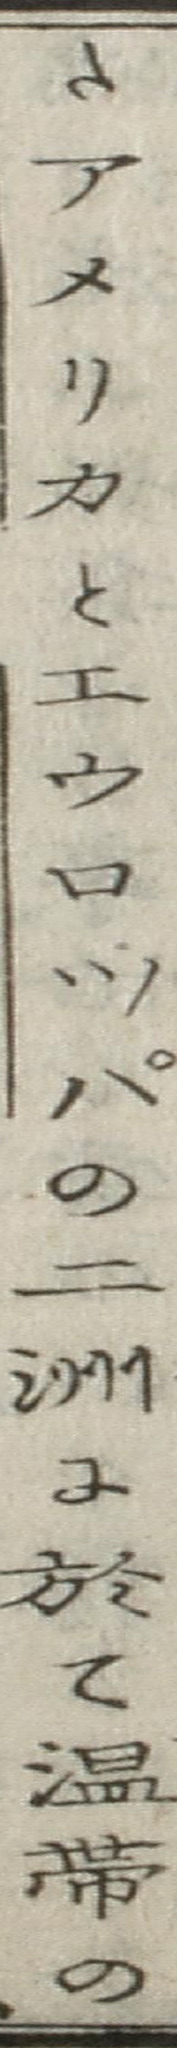たアメリカとエウロツパの二洲に於て温帯の
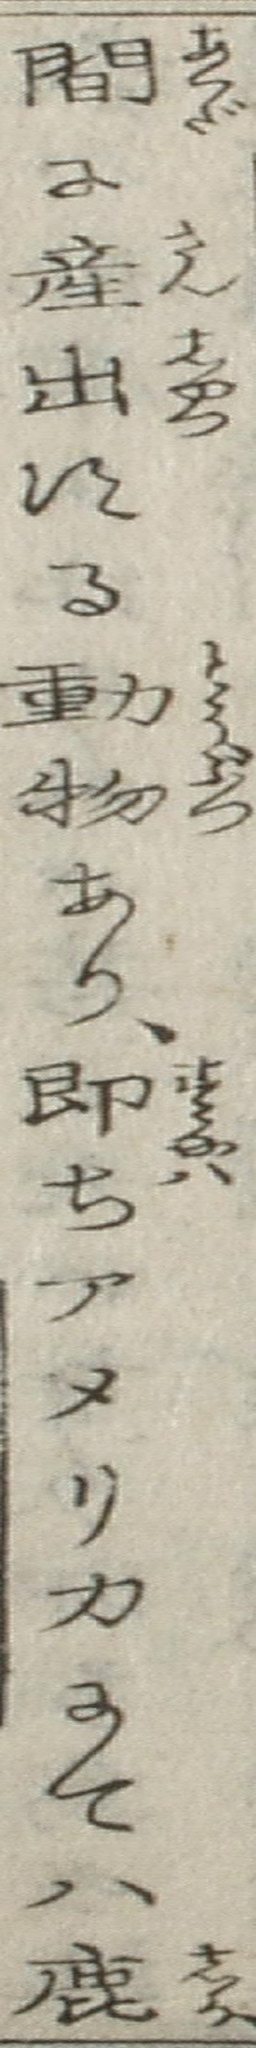間に産出する動物あり、即ちアメリカにては鹿、
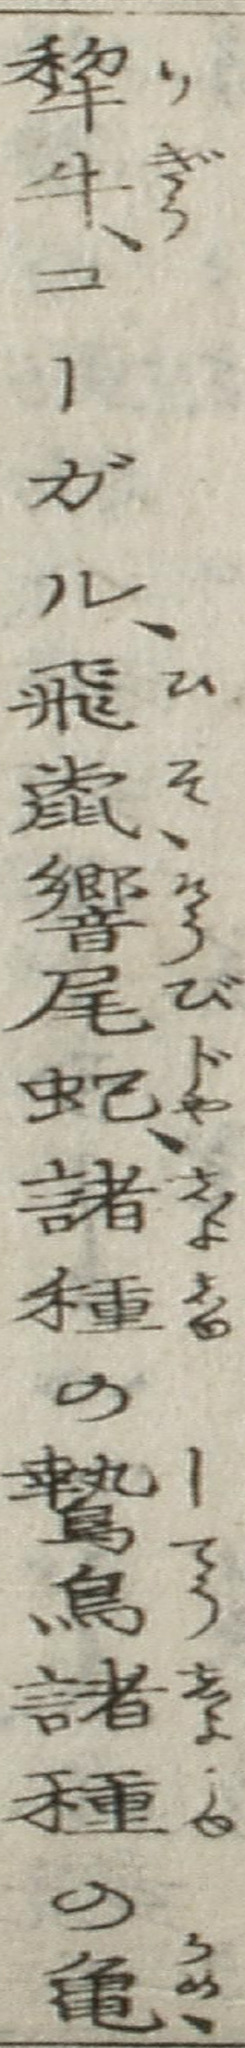犂牛、コーガル、飛鼠、響尾蛇、諸種の鷙鳥諸種の亀、
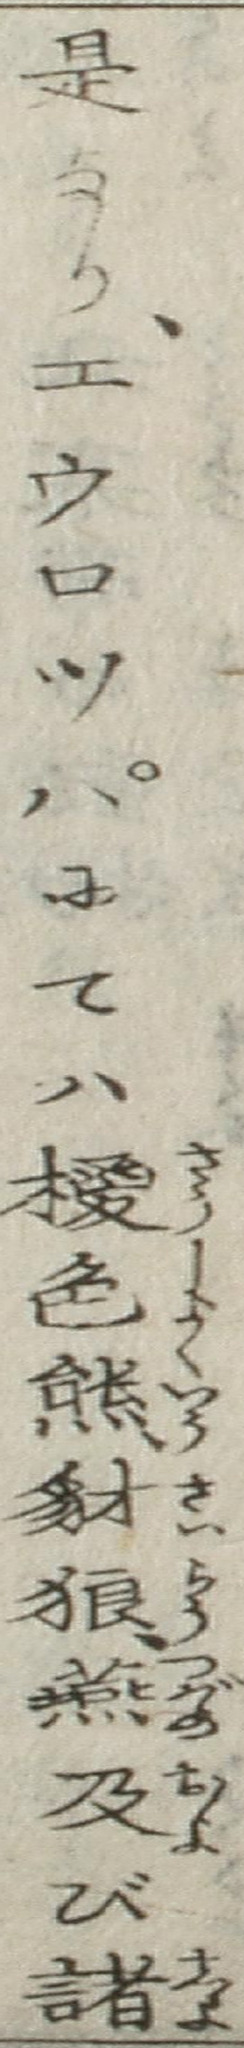是なり、エウロツパにては棕色熊、豺狼、燕及び諸
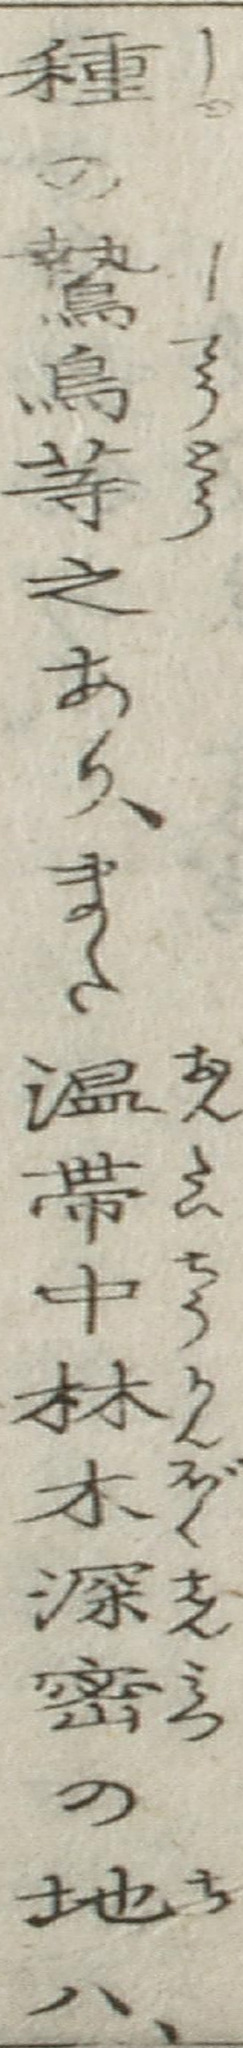種の鷙鳥等之あり、また温帯中林木深密の地は、
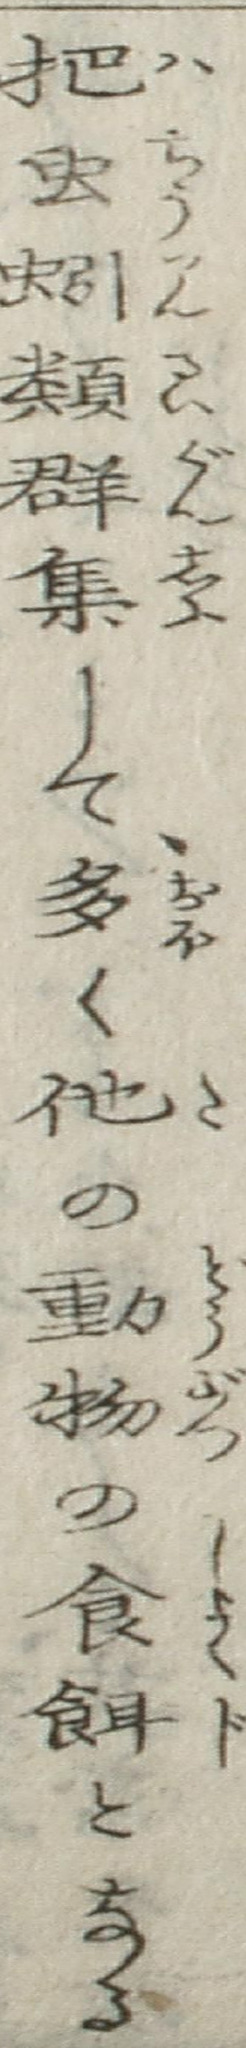把虫蚓類群集して、多く他の動物の食餌となる
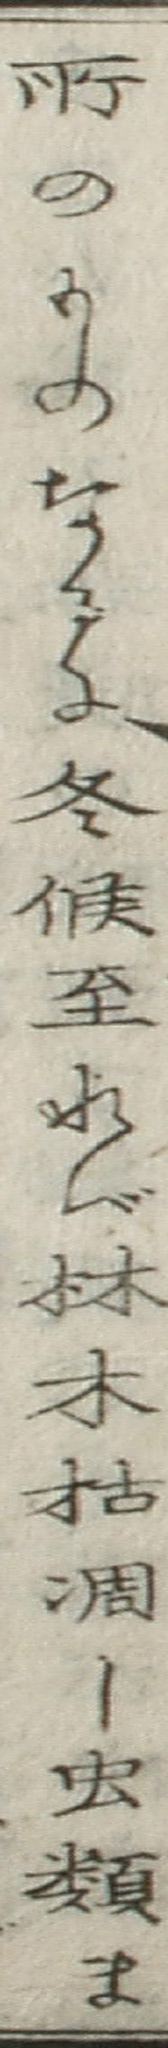所のものなるに、冬候至れば林木枯凋し、虫類ま
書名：訓蒙　天然地理學　下
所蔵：東京大学地震研究所図書室 Earthquake Research Institute Library, The University of Tokyo, JAPAN
